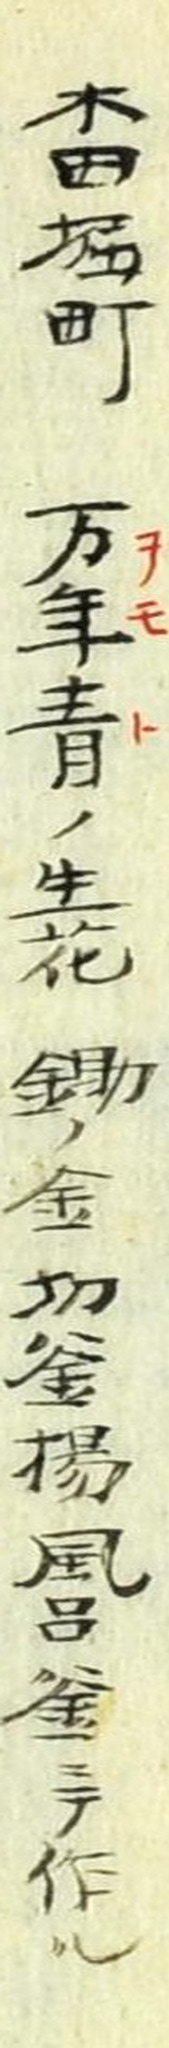木田堀町万年青ノ生花鋤ノ金功釜揚風呂釜ニテ作ル
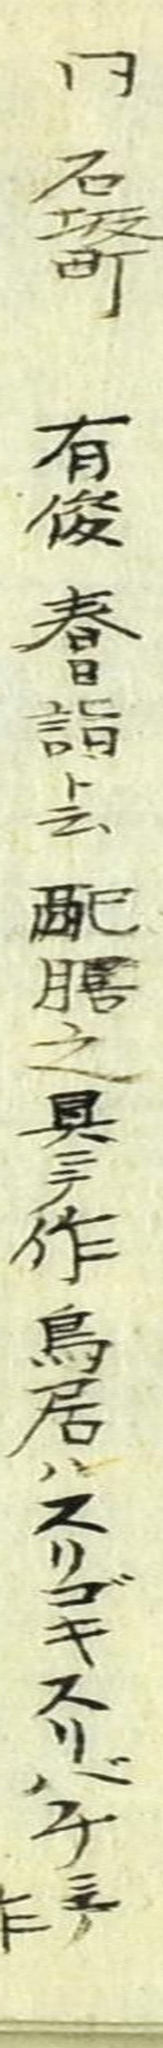同石坂町有俊春日詣ト云配膳之具ニテ作鳥居ハスリゴキスリバチニテ作
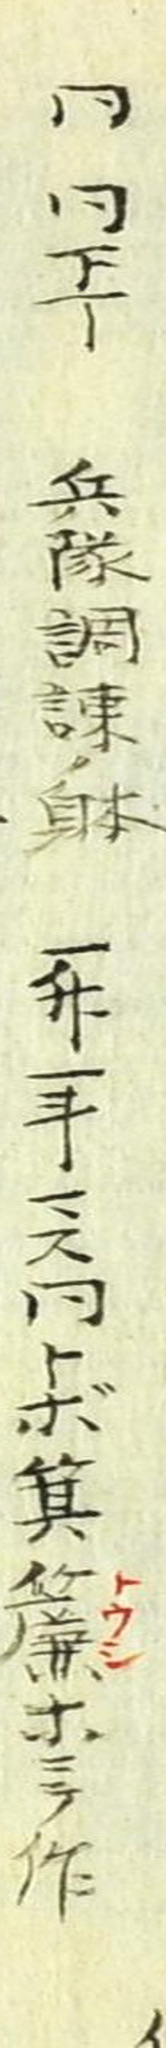同同下丁兵隊調諌ノ体一升一斗マス同トボ箕簾等ニテ作
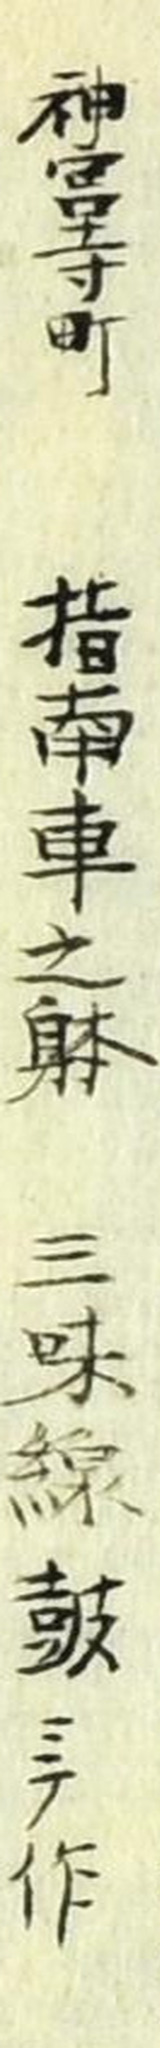神宮寺町指南車之体三味線鼓ニテ作
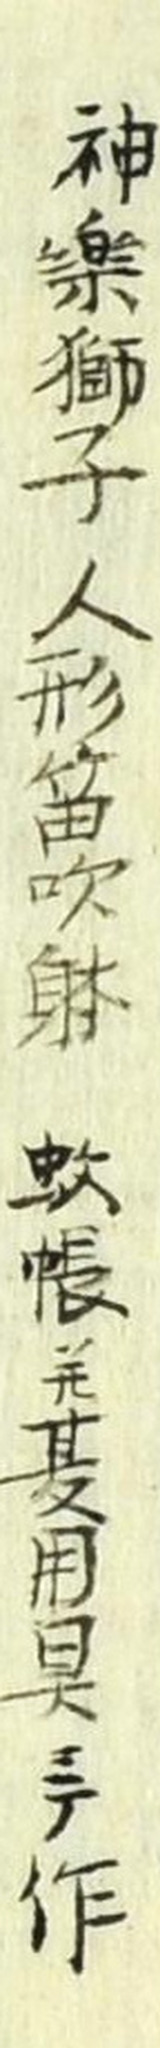神楽獅子人形笛吹体蚊帳幷夏用具ニテ作
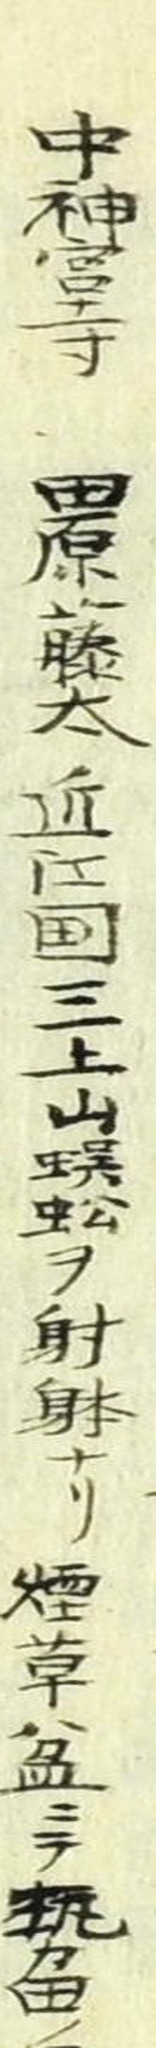中神宮寺田原藤太近江国三上山蜈蚣ヲ射体ナリ煙草盆ニテ勢田ノ橋
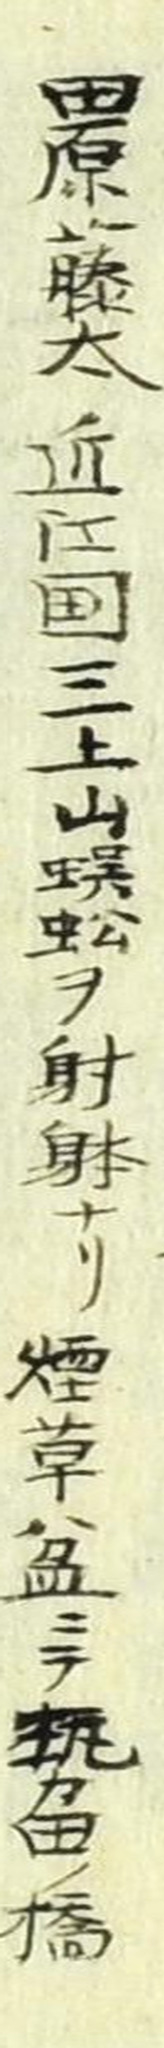中神宮寺田原藤太近江国三上山蜈蚣ヲ射体ナリ煙草盆ニテ勢田ノ橋
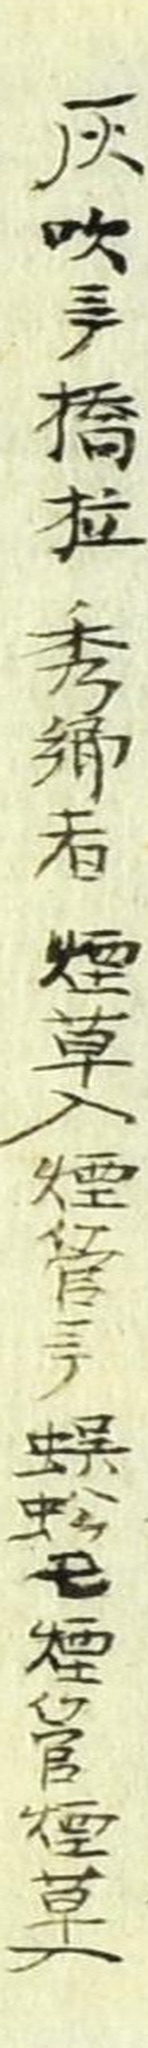灰吹ニテ橋柆秀郷者煙草入煙管ニテ蜈蚣モ煙管煙草入
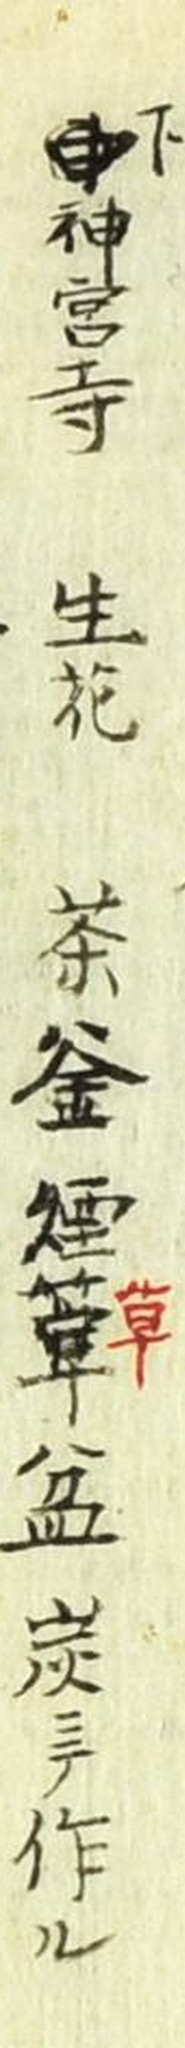中神宮寺生花茶釜煙草盆炭ニテ作ル
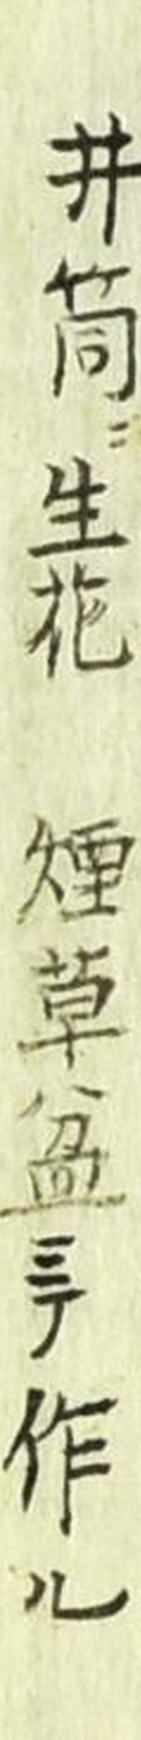井筒ニ生花煙草盆ニテ作ル
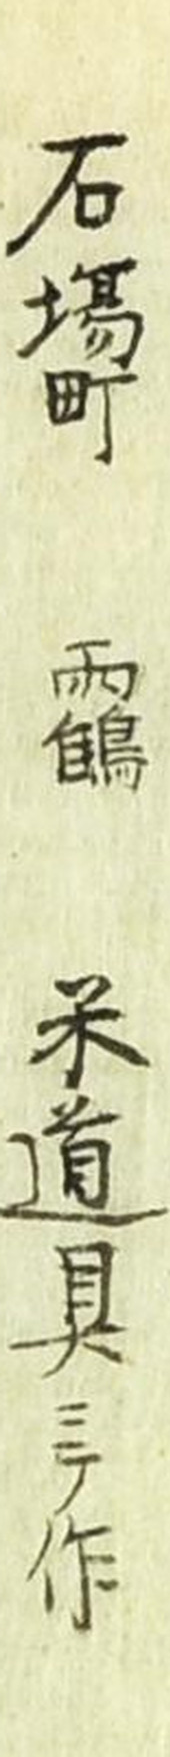石場町鶴米道具ニテ作
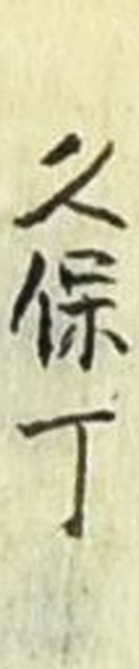久保丁
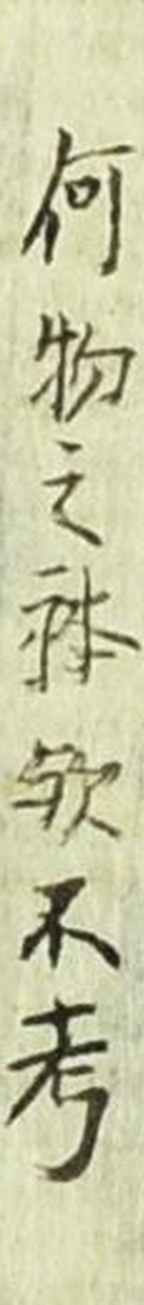何物之体歟不考
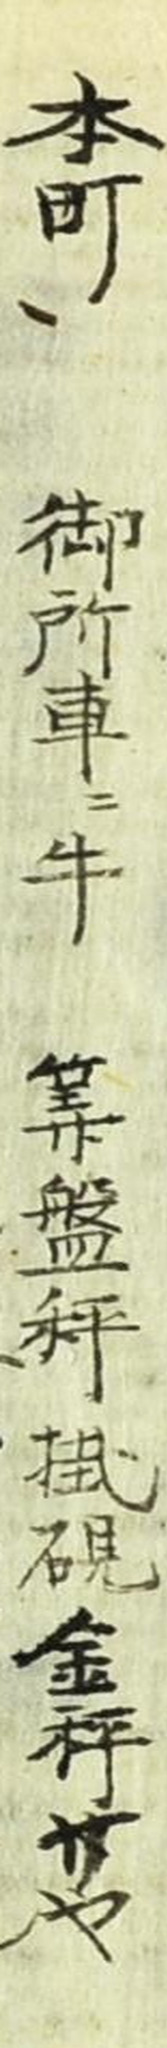本町御所車ニ牛算盤秤掛硯金秤サヤ
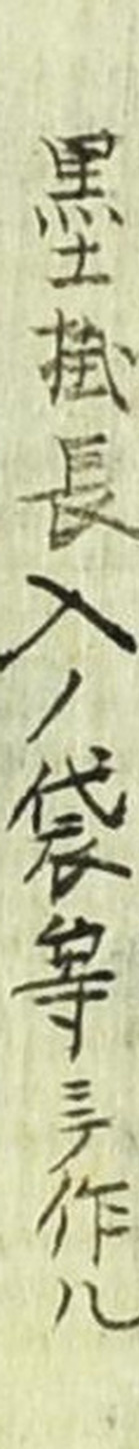墨掛長入ノ袋等ニテ作ル
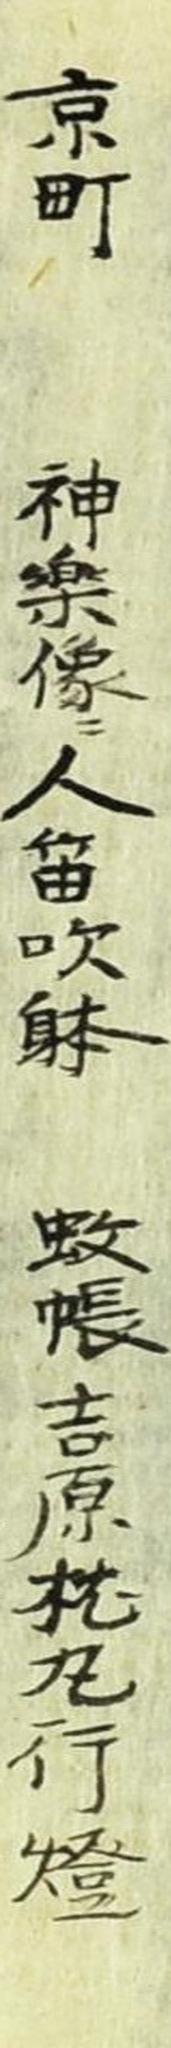京町神楽像ニ人笛吹体蚊帳吉原枕丸行燈
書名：（日記）
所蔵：福井県文書館 Fukui Prefectural Archives
